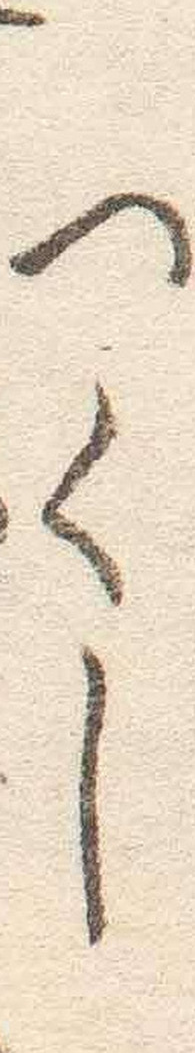つくし
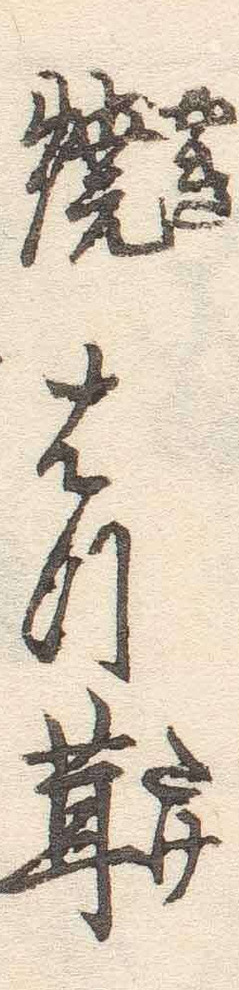焼はつ茸
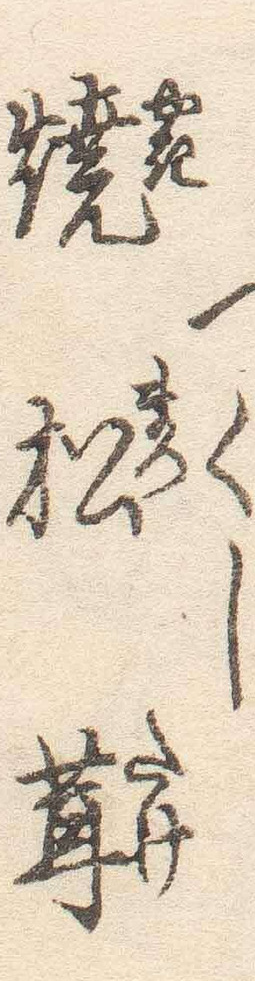焼松茸
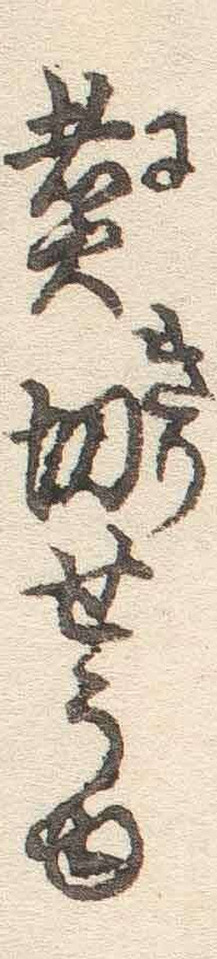煮切せうゆ
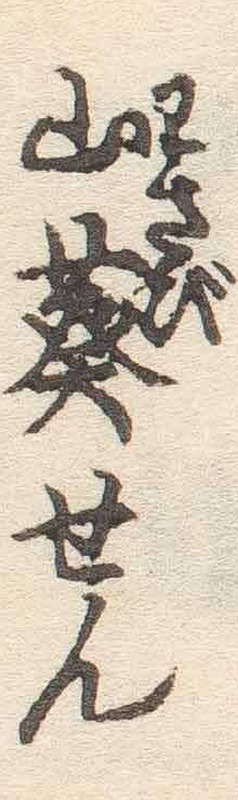山葵せん
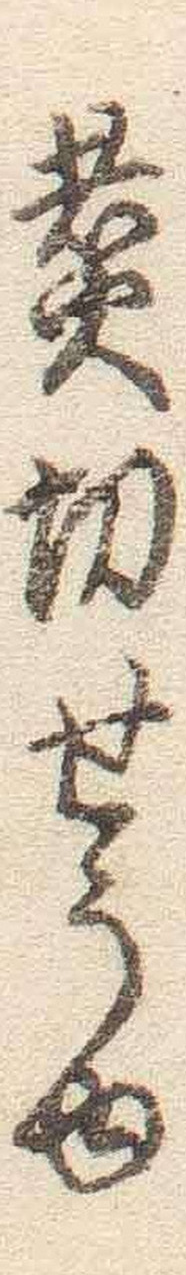煮切せうゆ
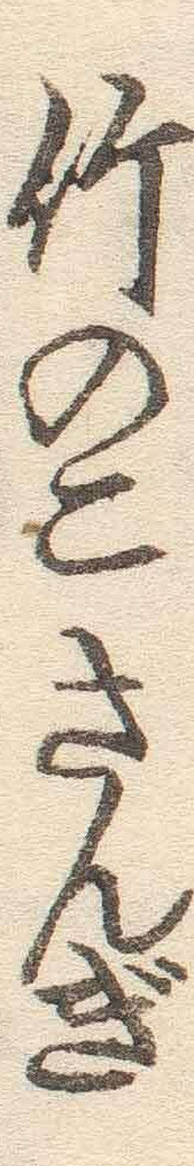竹のこさんぎ
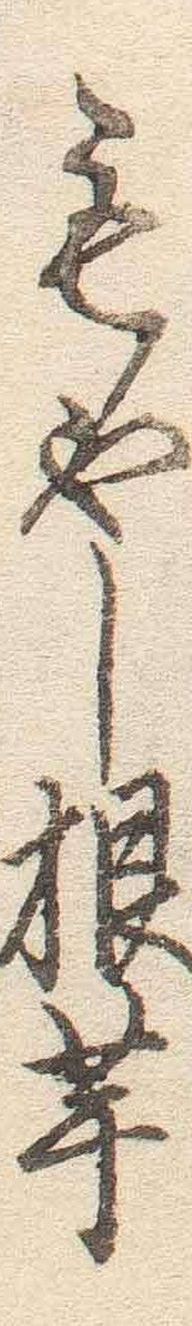もやし根芋
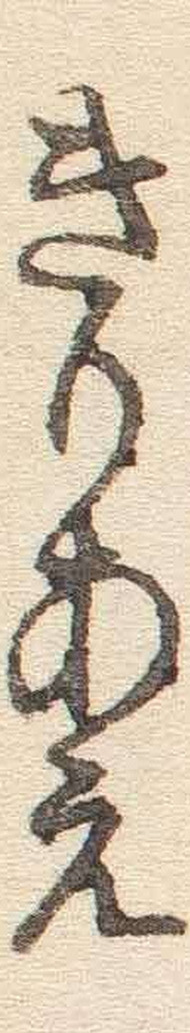きりあえ
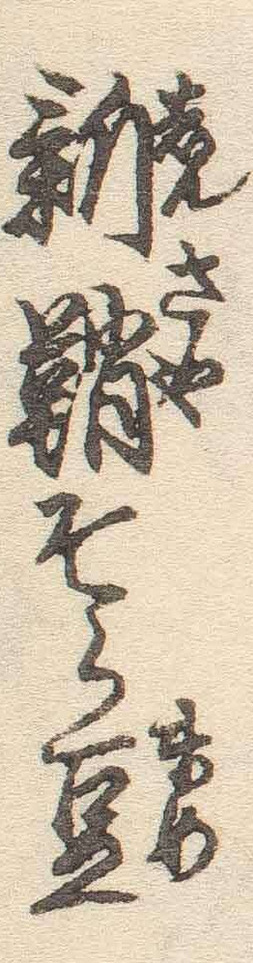新鞘そら豆
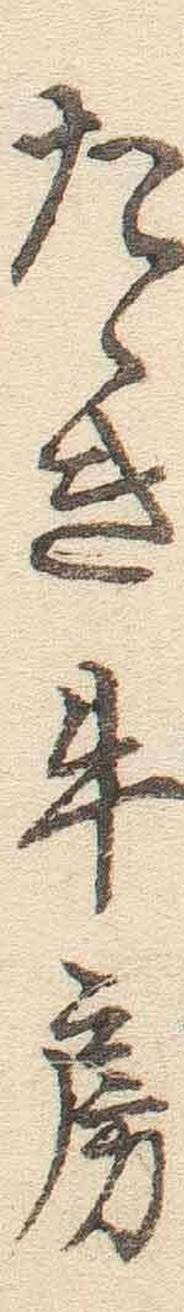たゝき牛蒡
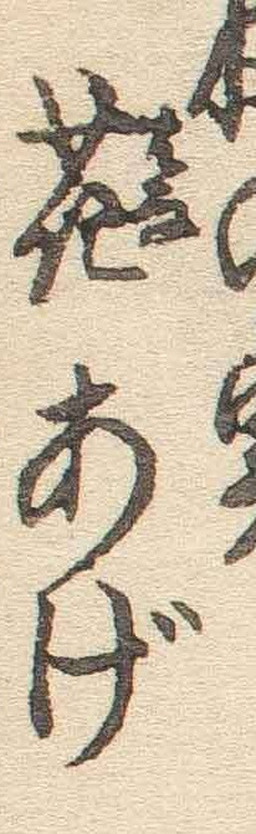花あげ
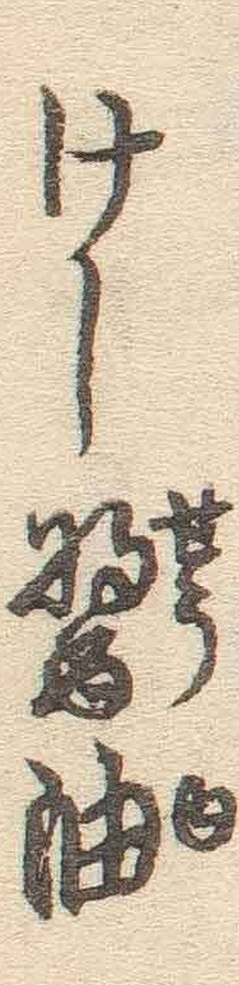けし醤油
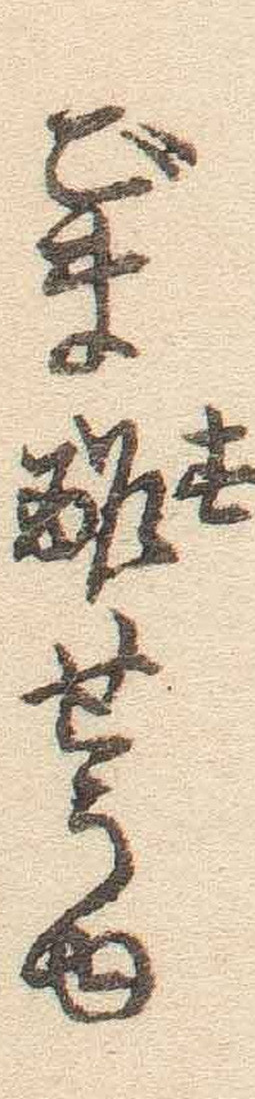ごま酢せうゆ

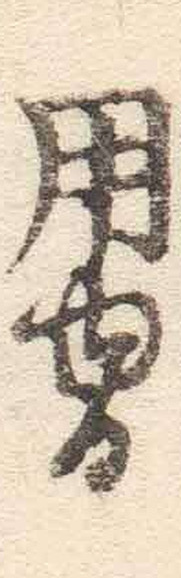用ゆる
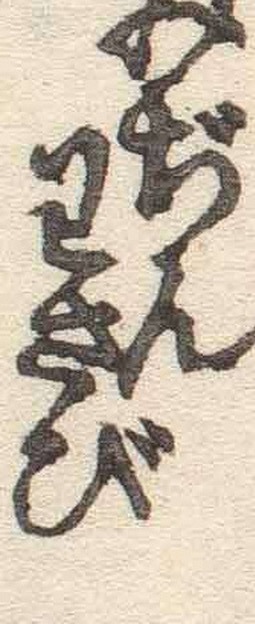わさび
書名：料理通
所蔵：東京学芸大学附属図書館 国文学研究資料館
